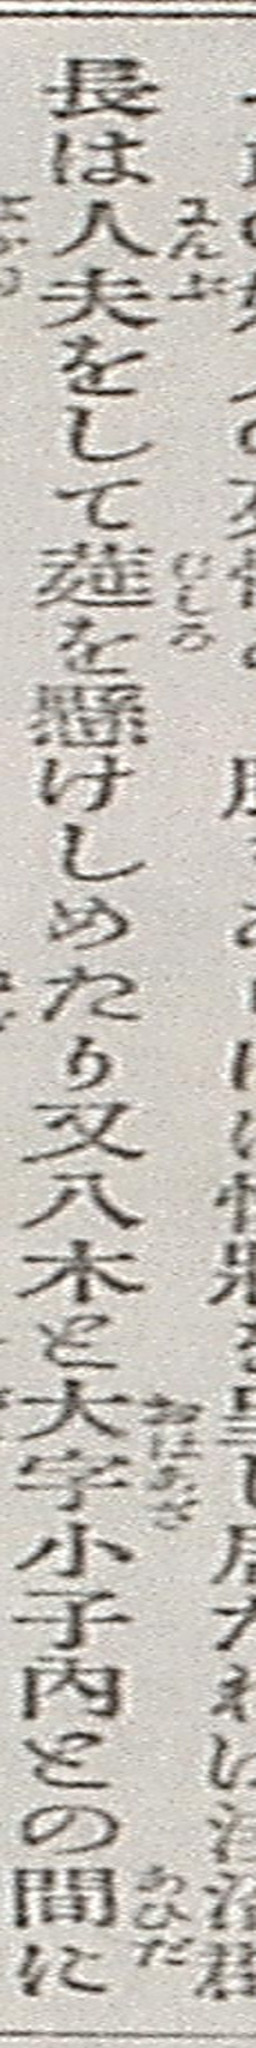長は人夫をして筵を懸けしめたり又八木と大字小子内との間に
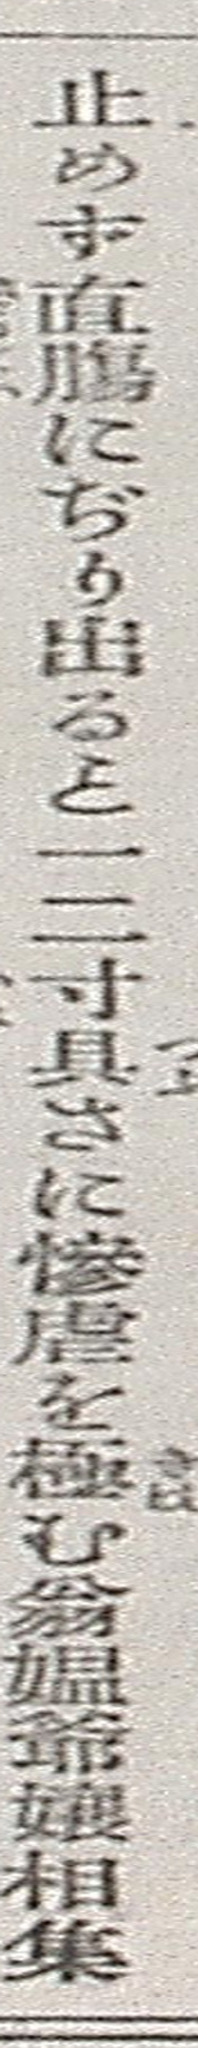止めず直腸にぢり出ること一二寸具さに惨虐を極む翁媼爺嬢相集
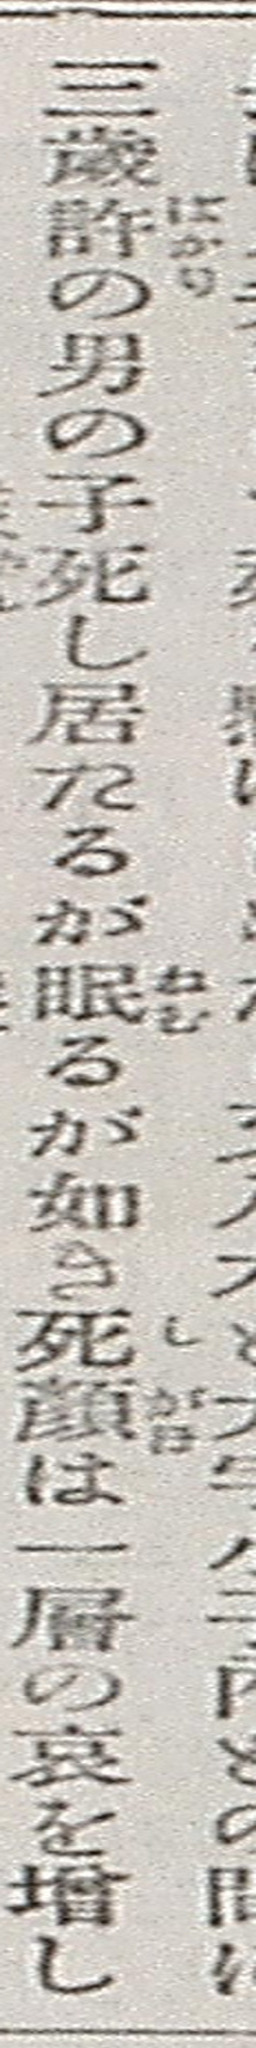三歳許の男の子死し居たるが眠るが如き死顔は一層の哀を増し
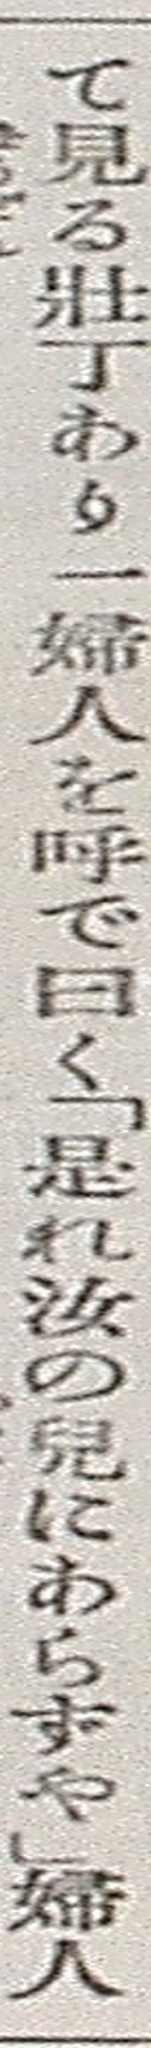て見る壮丁あり一婦人を呼で曰く「是れ汝の兒にあらずや」婦人
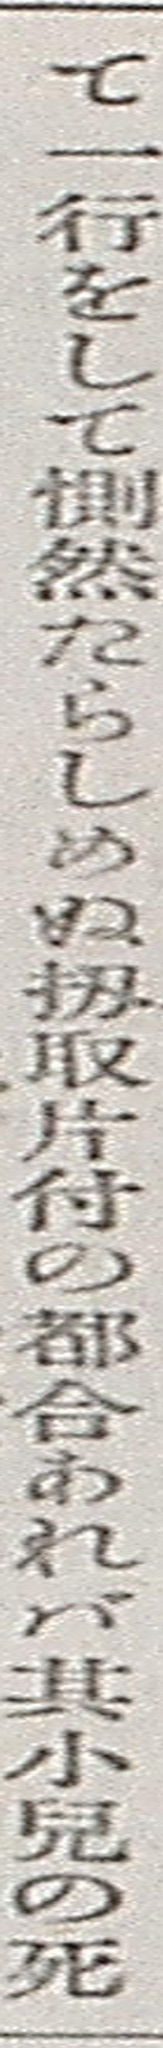て一行をして惻然たらしめぬ扨取片付の都合あれば其小兒の死
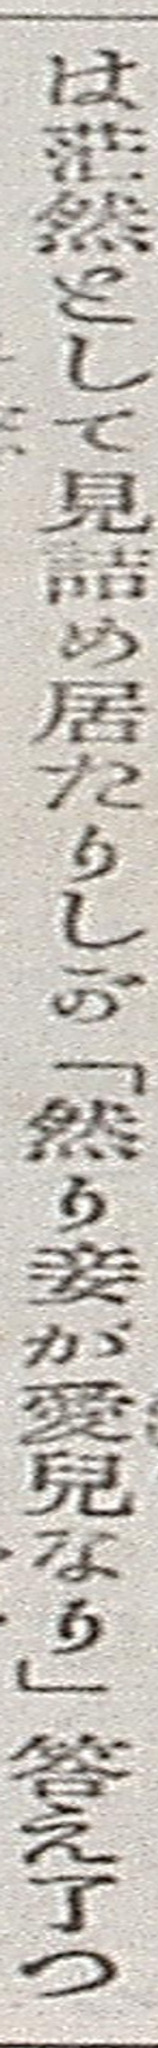は茫然として見詰め居たりしが「然り妾が愛児なり」答え了つ
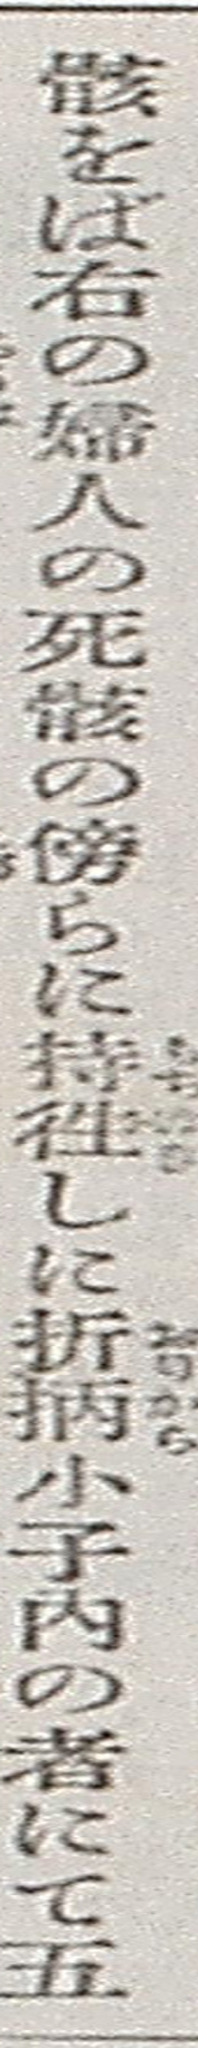骸をば右の婦人の死骸の傍らに持往しに折柄小子内の者にて五
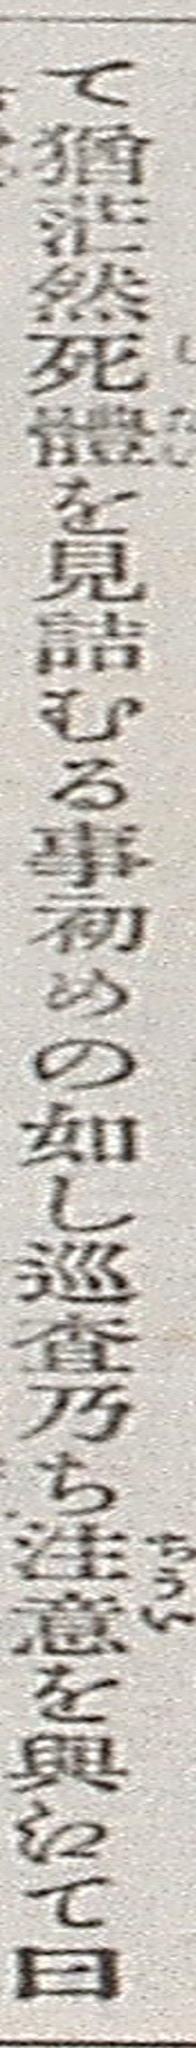て猶茫然死体を見詰むる事初めの如し巡査乃ち注意を与えて曰
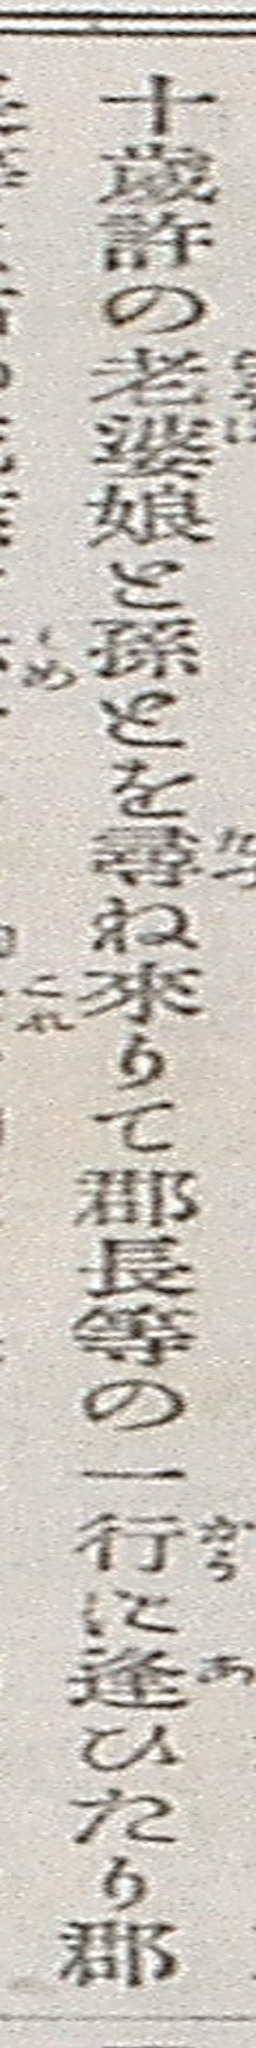十歳許の老婆娘と孫とを尋ね来りて郡長等の一行に逢ひたり郡
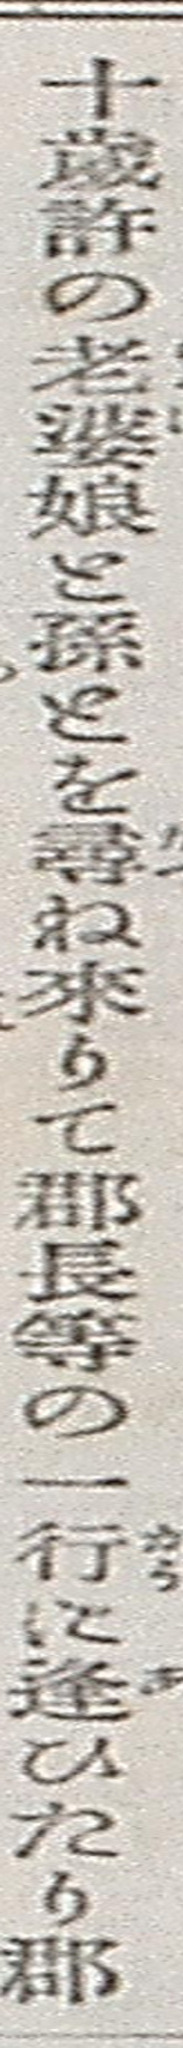十歳許の老婆娘と孫とを尋ね来りて郡長等の一行に逢ひたり郡
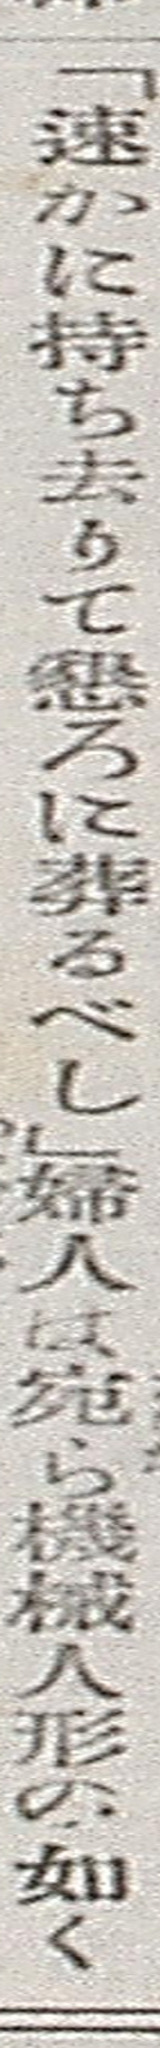「速かに持ち去りて懇ろに葬るべし」婦人は宛ら機械人形の如く
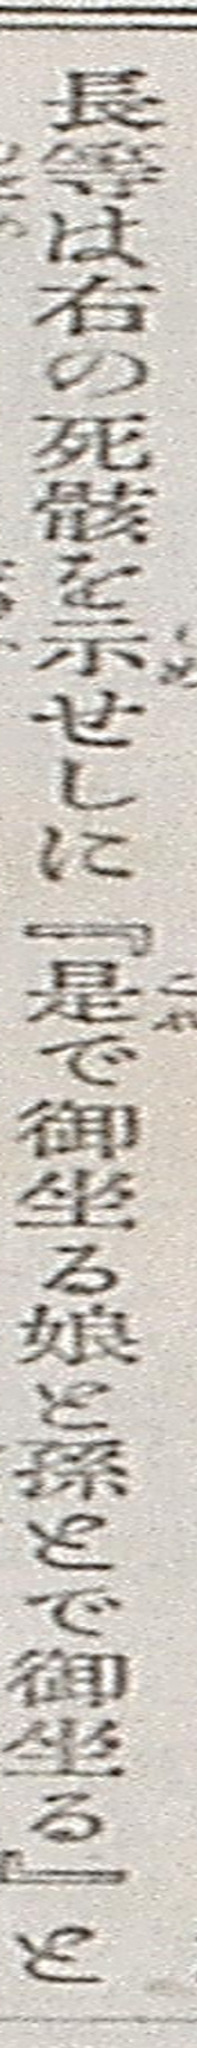長等は右の死骸を示せしに『是で御坐る娘と孫とで御坐る』と
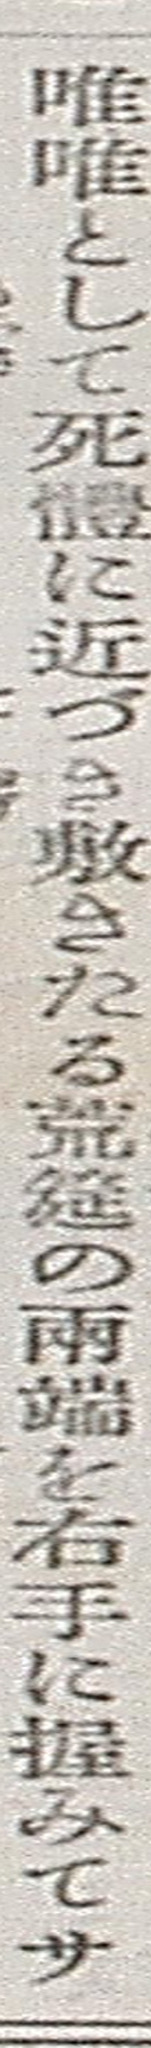唯唯として死体に近づき敷きたる荒筵の両端を右手に握みてサ
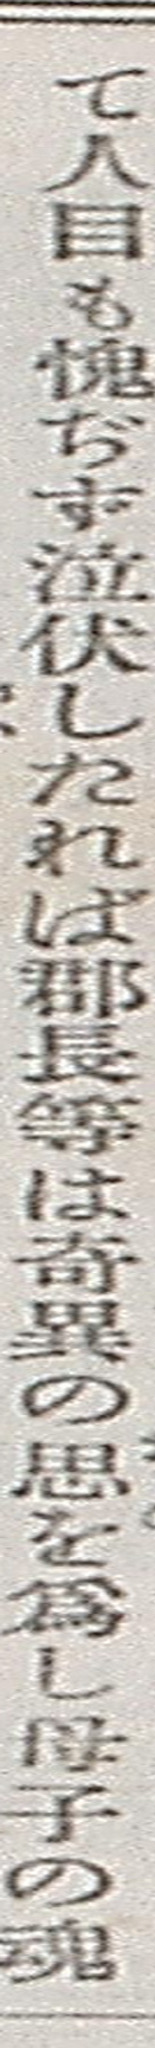て人目も愧ぢず泣伏したれば郡長等は奇異の思を為し母子の魂
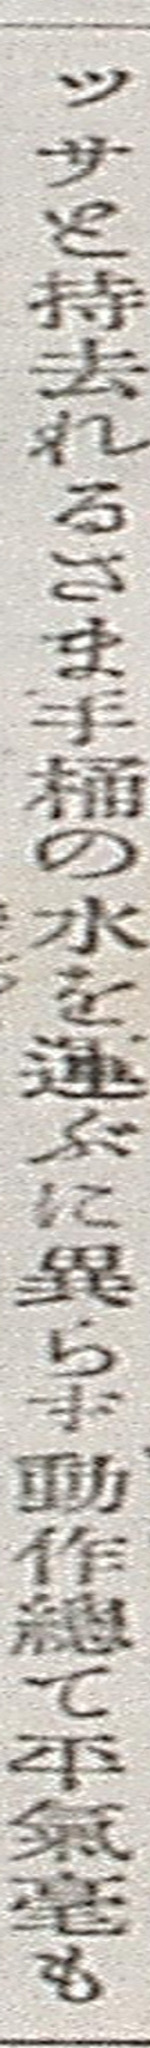ッサと持去れるさま手桶の水を運ぶに異らず動作総て平気毫も
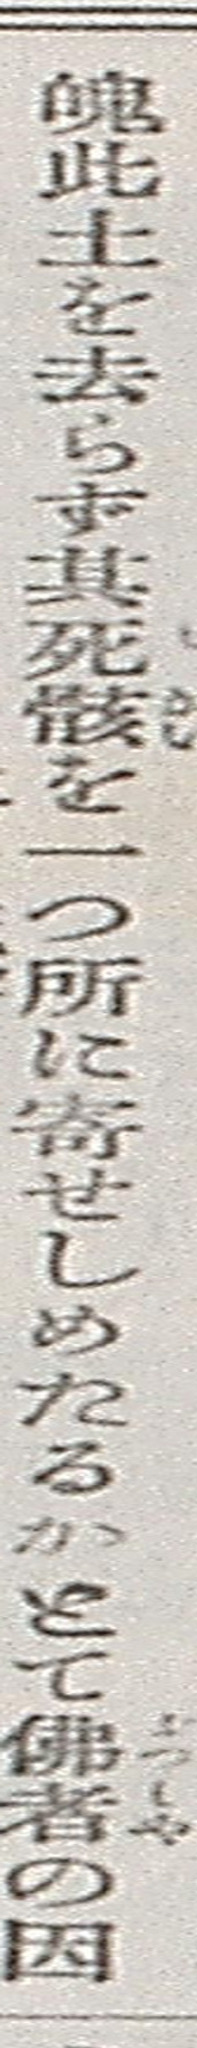魄此土を去らず其死骸を一つ所に寄せしめたるかとて佛者の因
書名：風俗畫報臨時増刊第百二十號　大海嘯被害録（下）
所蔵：東京大学地震研究所図書室 Earthquake Research Institute Library, The University of Tokyo, JAPAN
